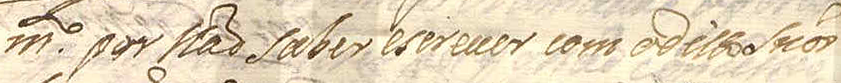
m.to por não saber escreuer com o ditto sn̄or
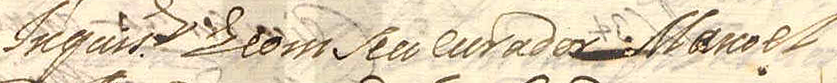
Inquis.or E com seu curador: Manoel
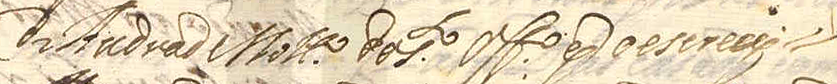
de Andrade not.ro do s.to off.o q̄ o escreuj//
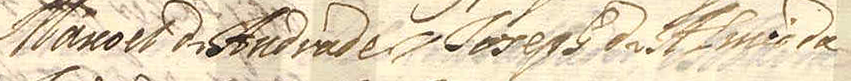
Manoel de Andrade// Iozeph de Almeida
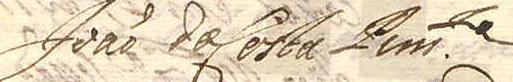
João da Costa Pim.ta
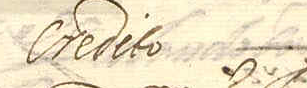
Credito
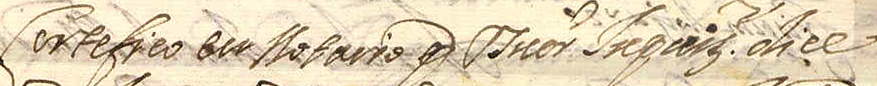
Certefico eu Notario q̄ O Snõr Inquiz.or dice
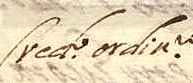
Cred.o ordin.ro
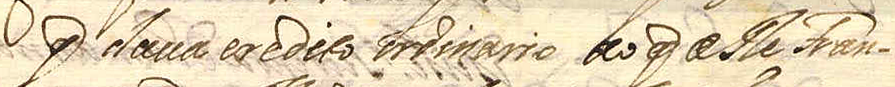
q̄ daua credito ordinario ao q̄ a Re Fran
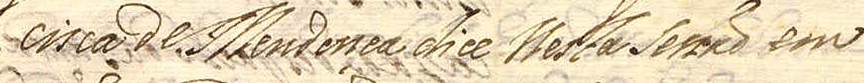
cisca de Mendonça dice nesta sessão em
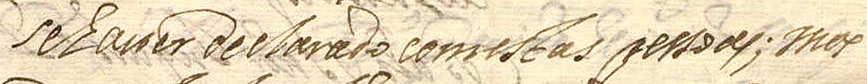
se hauer declarado com estas pessoas; mas
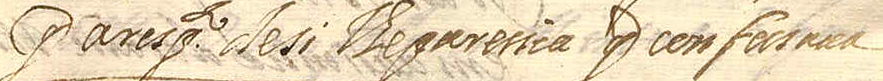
q̄ a resp.to de si lhe paressia q̄ confessaua
